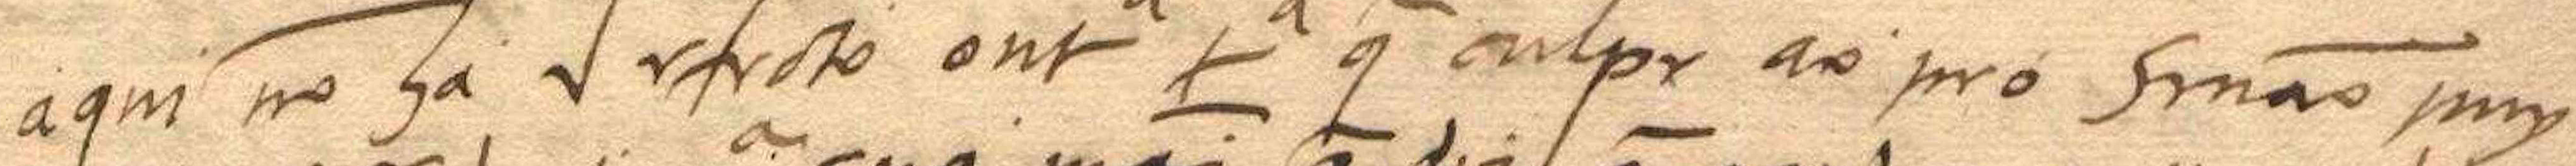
aqui n̄o ha ē efecto outa ta q̄ culpe ao reo Senão ruy
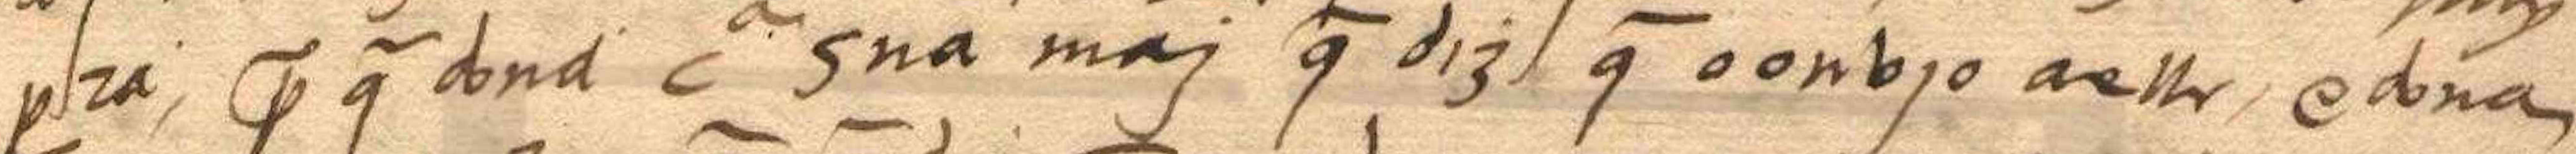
ꝑra p̄o q̄ dona ca sua mãj q̄ diz q̄ o ouvjo a elle / e dona
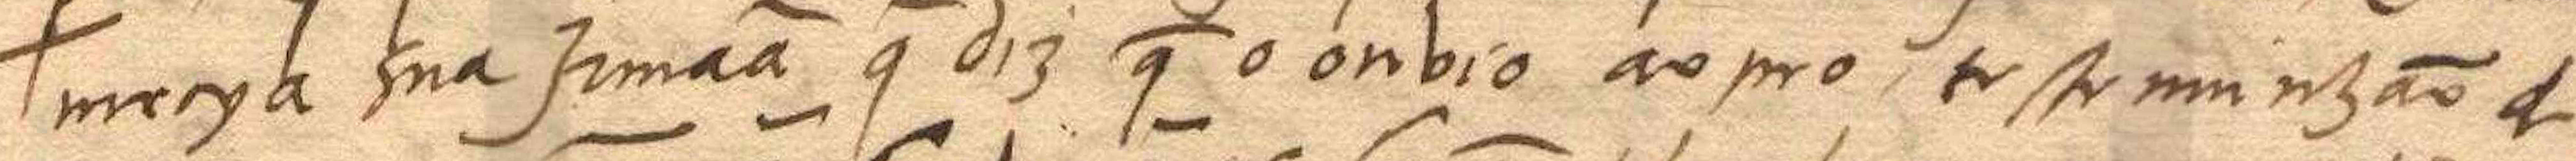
mecya Sua Jrmaā q̄ diz q̄ o ouvio ao reo / testemunhão de
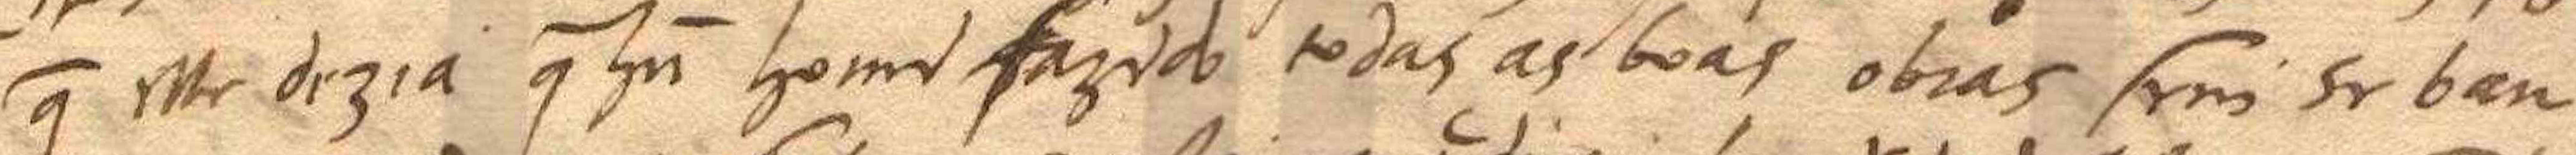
q̄ elle dizia q̄ hū homē fazēdo todas as boas obras sem se bau
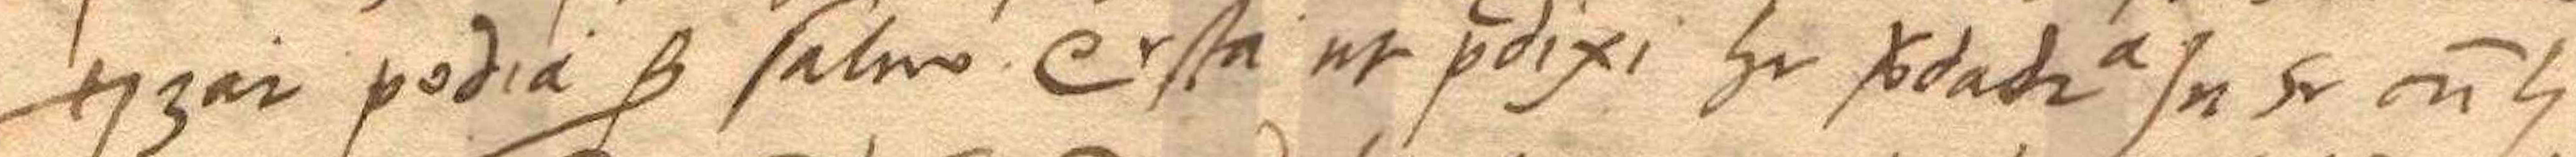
tjzar podia ꞩ saluo. e esta ut p̄dixi he ꝟdadra Jn se cū lj
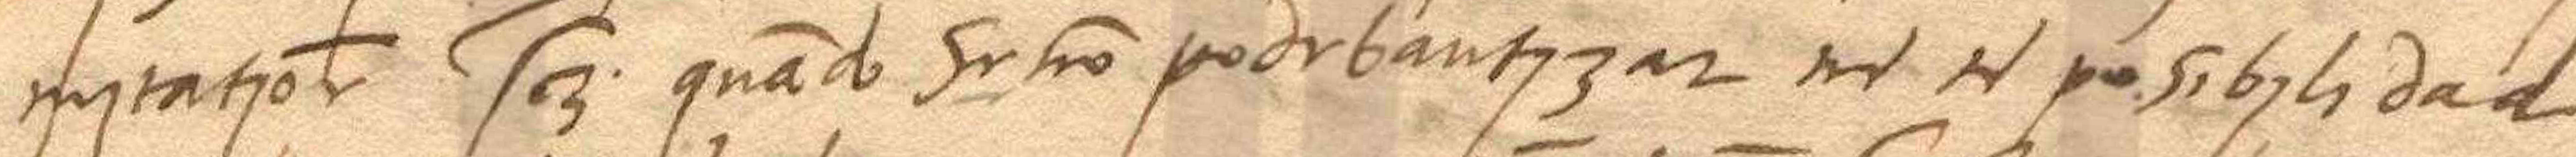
mjtatjōe scz. quādo Se nō pode bautjzar nē tē posibjlidade
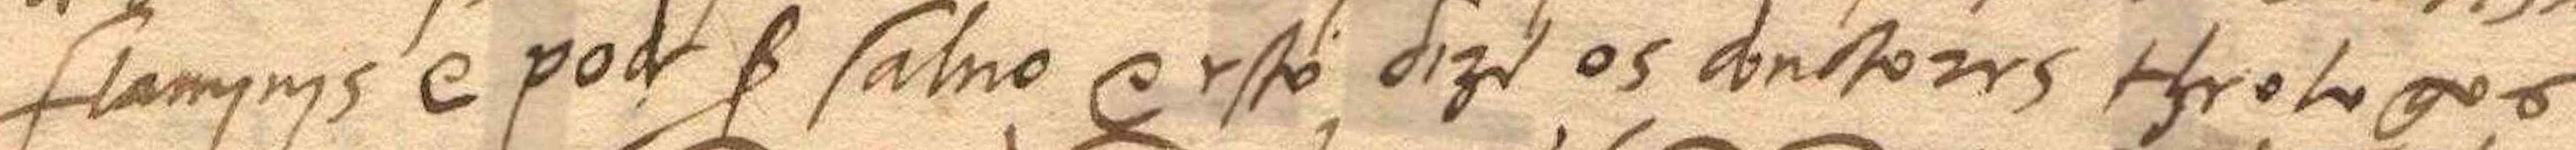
Flamjnjs e pode ꞩ saluo. e esto dizē os douctores theologos
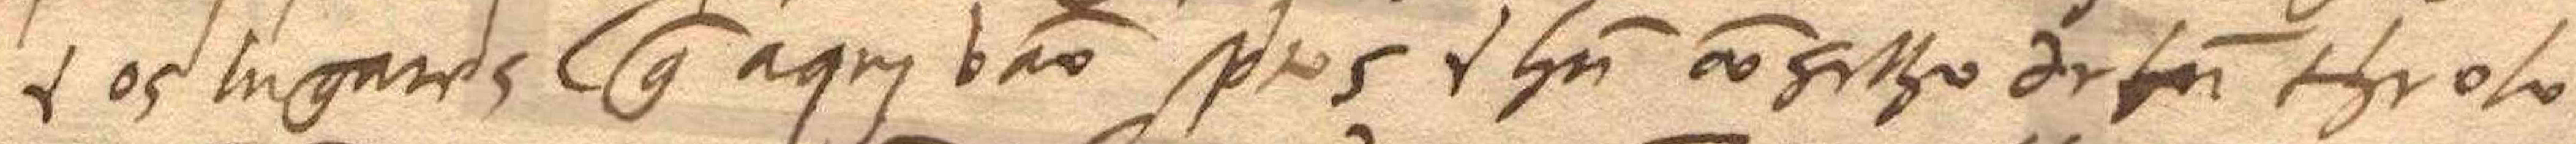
ē os lugares q̄ aquj vão spitos ē hū c̄oselho de hū theolo
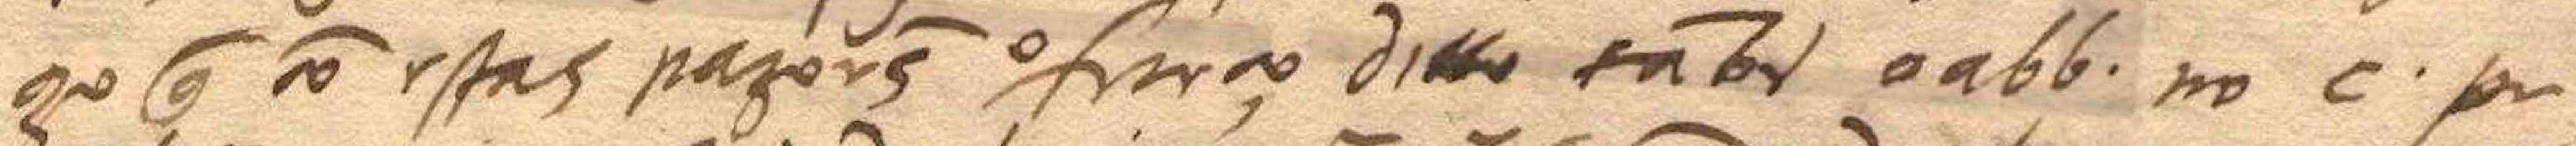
go q̄ c̄o estas razões ofereço ditto tābē o abb. no c. pe
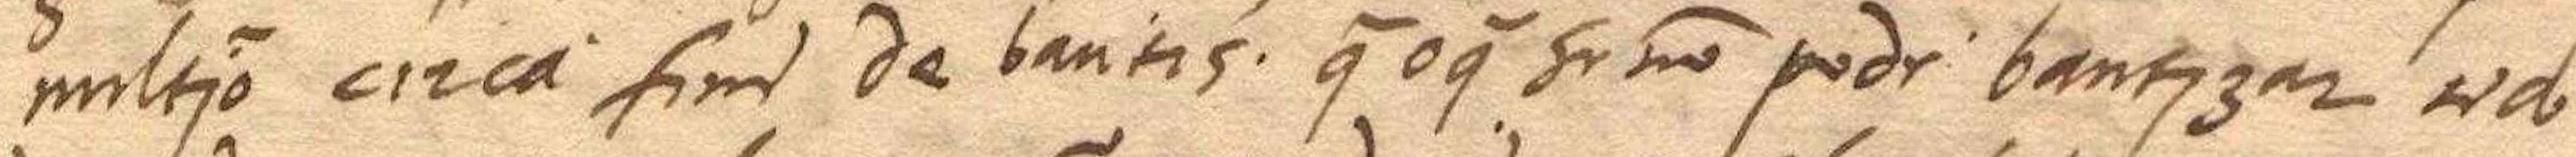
nultjō circa finē de bautis. q̄ o q̄ se n̄o pode bautjzar tēdo
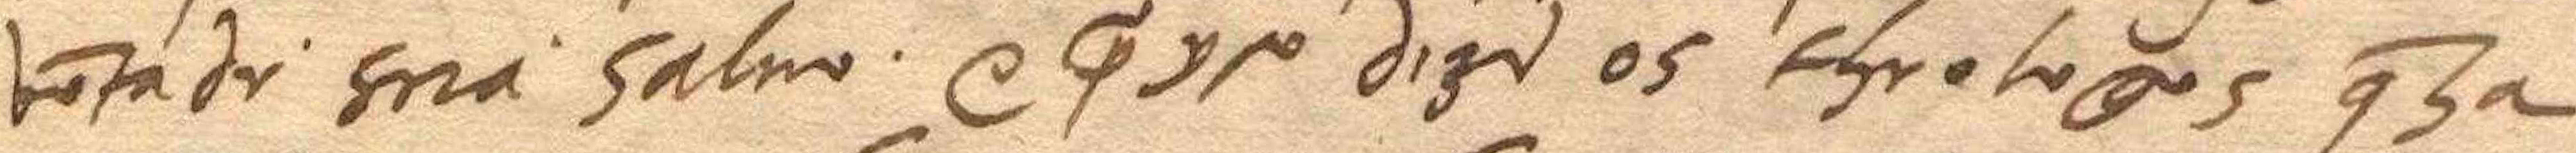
vōtade sera saluo. e p̄o yso dizē os theologos q̄ ha
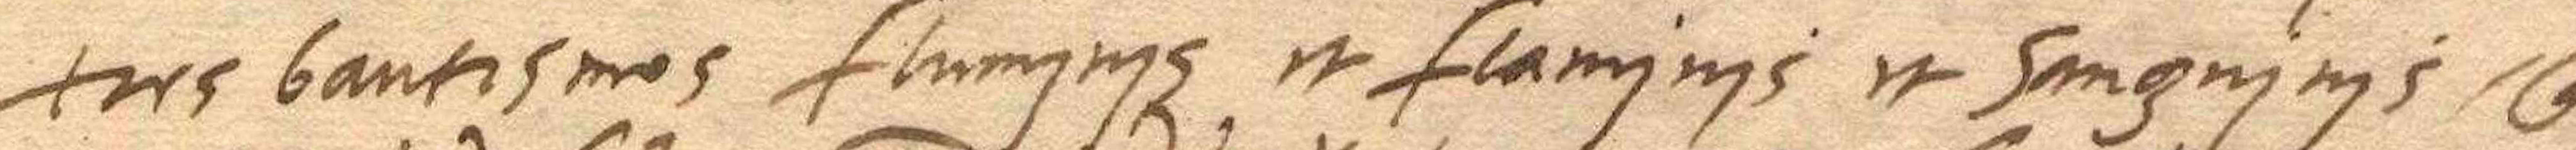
tres bautismos Flumjnjs et Flamjnjs et Sangujnjs / q̄
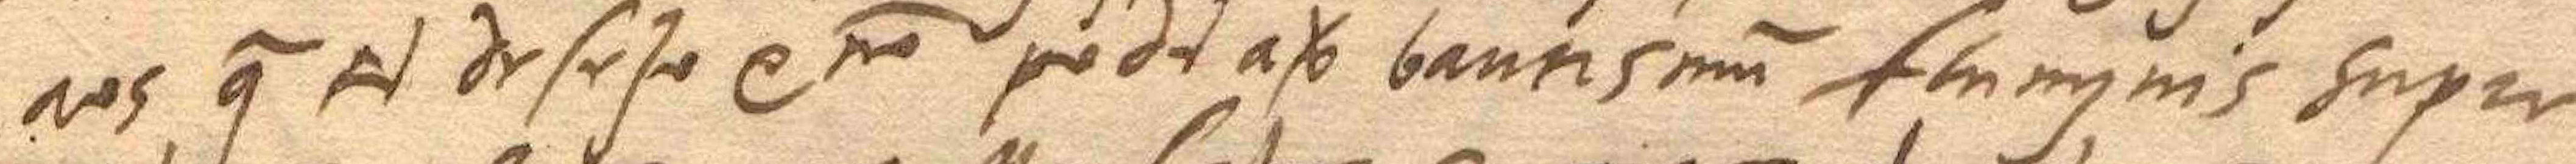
aos q̄ tē deseJo e n̄o podē aꝟ bautismū Flumjnis Supre
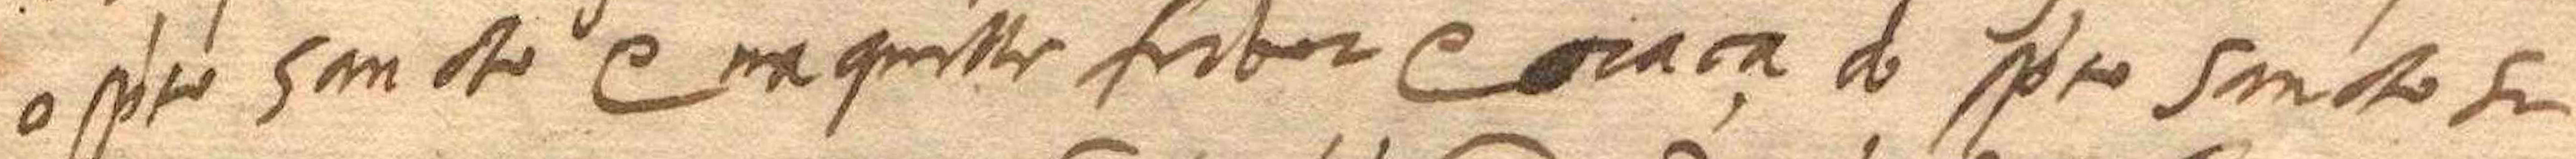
o spito Sancto e naquelle fervor e graça do spito Sancto se
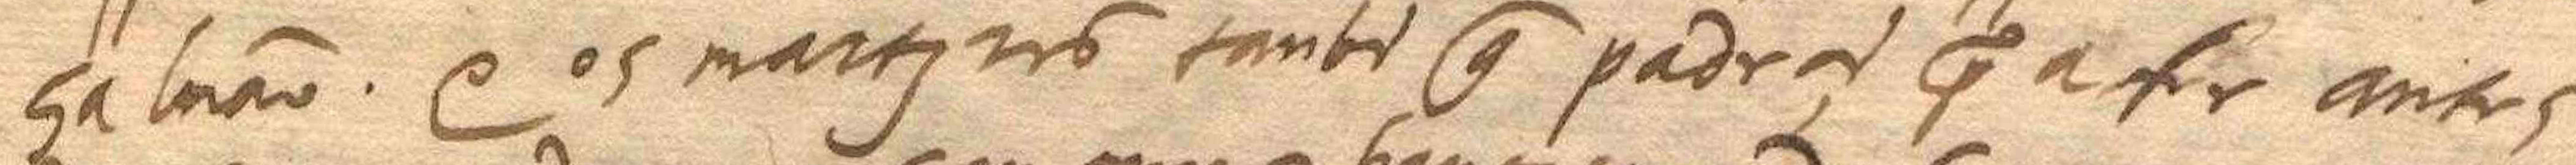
Saluão. e os martjres tanbē q̄ padeçē p̄o a fee antes
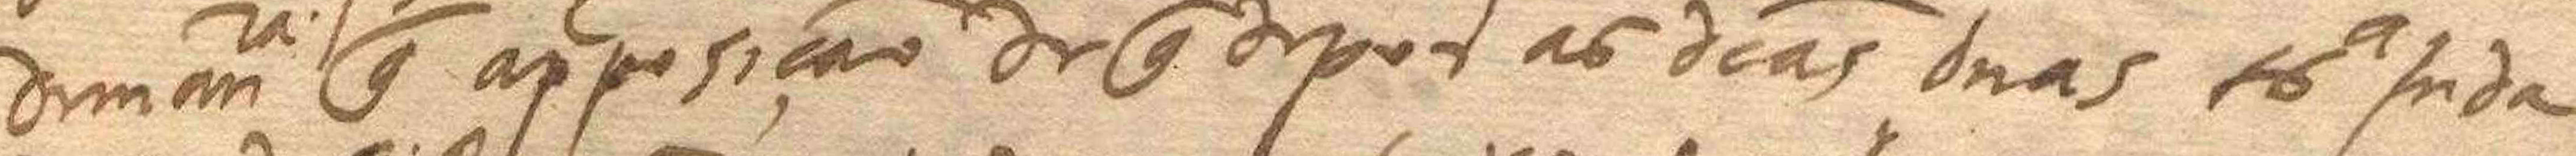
de manra q̄ a p̄posição de q̄ depoē as dcās duas tsa Jnda
